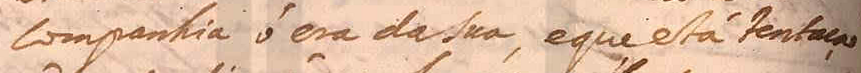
Companhia ó era da sua, e que está tentaçaõ
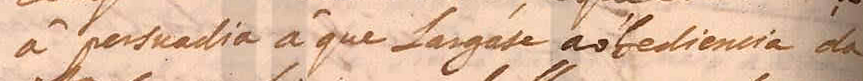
á persuadia á que Largase a obediencia da
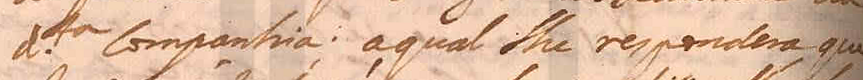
d.ta Companhia; a qual lhe respondera que
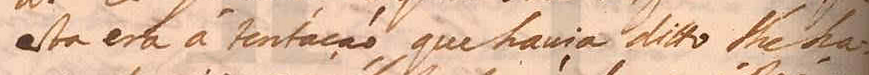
esta era á tentaçaõ, que hauia ditto lhe ha
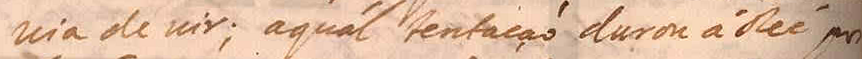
uia de uir, a qual tentaçaõ durou á Reé por
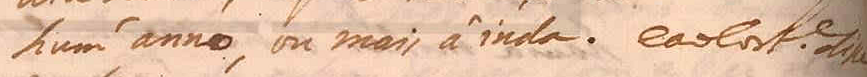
hum anno, ou mais áinda e ao Cost.e disse
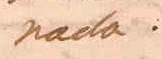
nada.
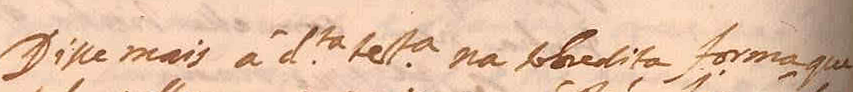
Disse mais á d.ta test.a na sobredita forma que
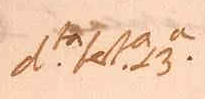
d.ta test.a 13.a
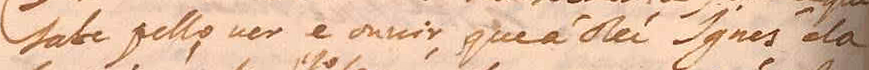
sabe pello uer, e ouuir, que á Reé Ignes da
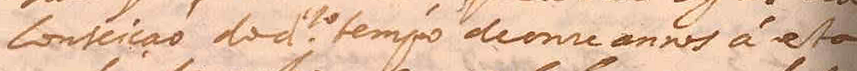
Conseiçaõ do d.to tempo de onze annos á esta
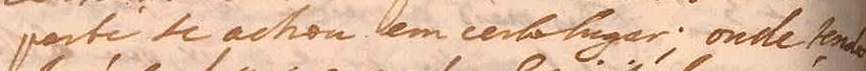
parte, se achou em certo lugar onde tendo
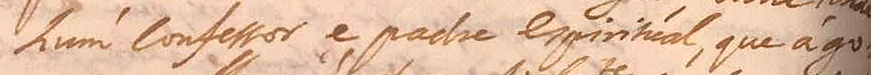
hum Confessor, e padre Espiritual, que á go
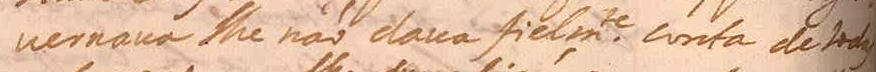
uernaua lhe naõ daua fielm.te conta de todas
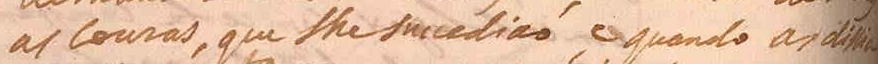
as couzas, que lhe succediaõ, e quando as dissia
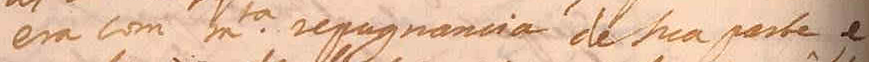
era com m.ta repugnancia de sua parte, e
